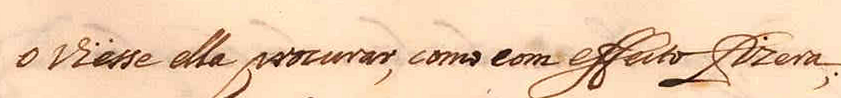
o viesse ella procurar, como com effeito fizera;
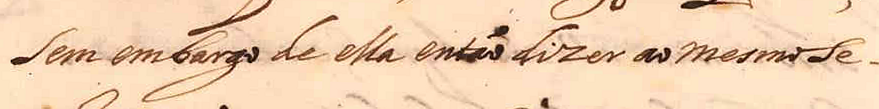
sem embargo de ella entaõ dizer ao mesmo se
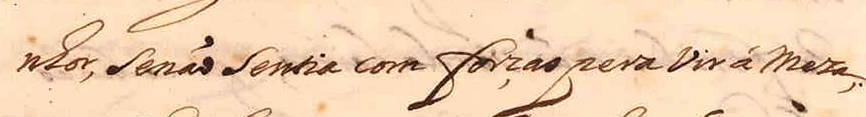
nhor, se não sentia com forças para vir á Meza,
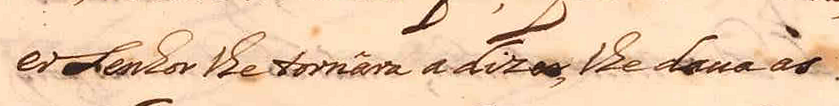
e o Senhor lhe tornâra a dizer, lhe daua as
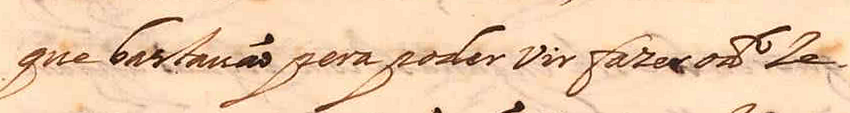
que bastauaõ pera poder vir fazer o d̄o Re
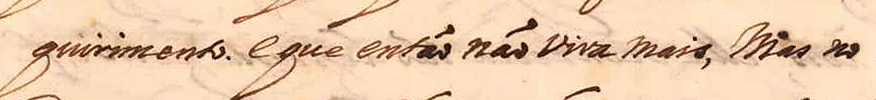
quirimento. e que então não vira mais, mas no
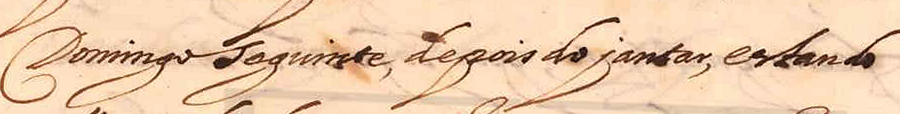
Domingo seguinte, depois do jantar, estando
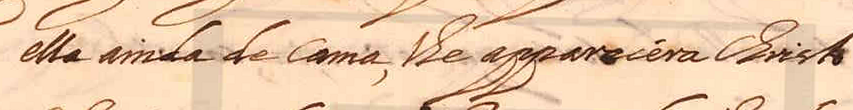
ella ainda de cama, lhe apparecera Christo
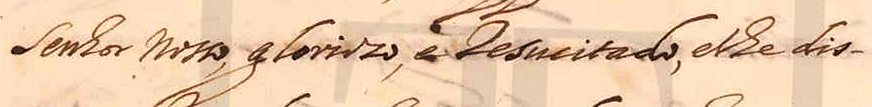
Senhor nosso, gloriozo, e Resucitado, e lhe dis
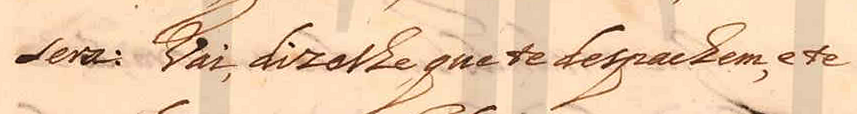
sera: Vai, dizelhe, que te despachem, e te
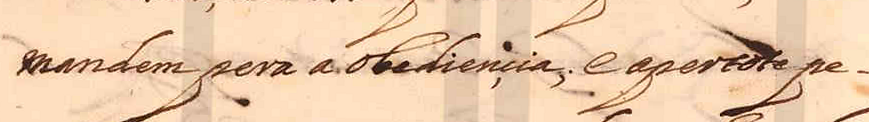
mandem pera a obediencia, e apertote pe
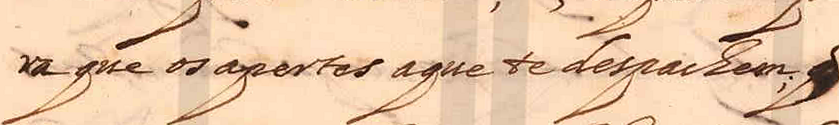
ra que os apertes a que te despachem, q̄
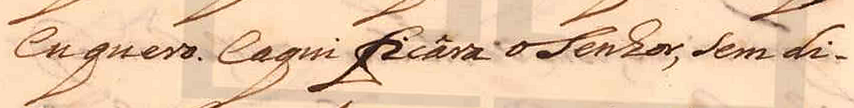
Eu quero. E aqui ficâra o Senhor, sem di
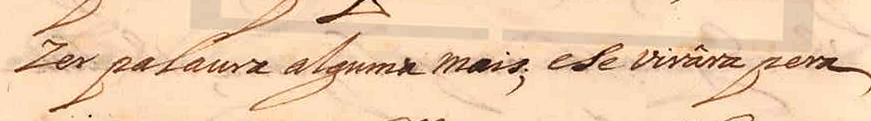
zer palaura alguma mais, e se virâra pera
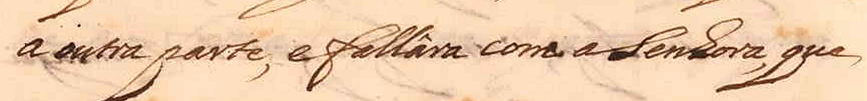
a outra parte, e fallâra com a Senhora, que
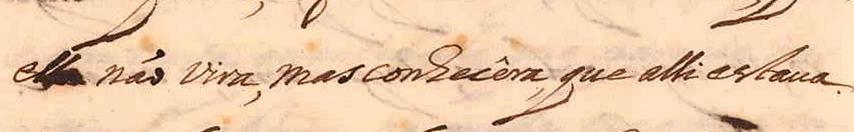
ella não vira, mas conhecêra, que alli estaua
